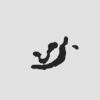可
